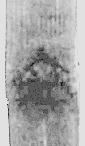六
